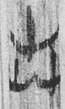卉（艸）
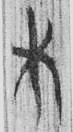木
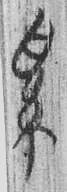○（奚）
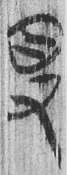○（得）
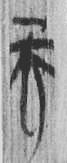而
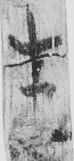生
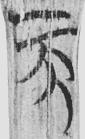天
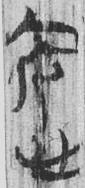○（近）
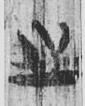之
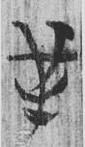矢
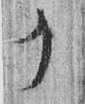人
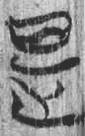是
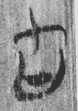古（故）
